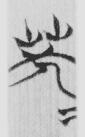艹犬=
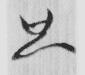也
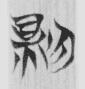則
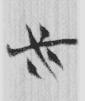必
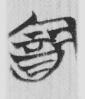酓
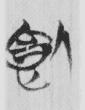飤
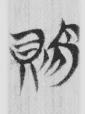賜
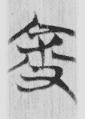{余又}
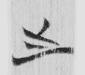之
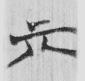亓
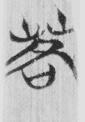茖
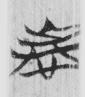者
